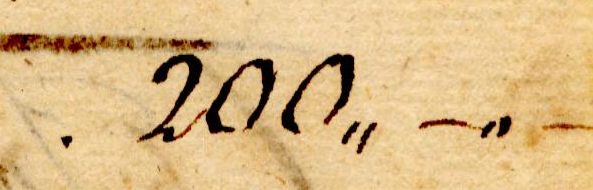200.-
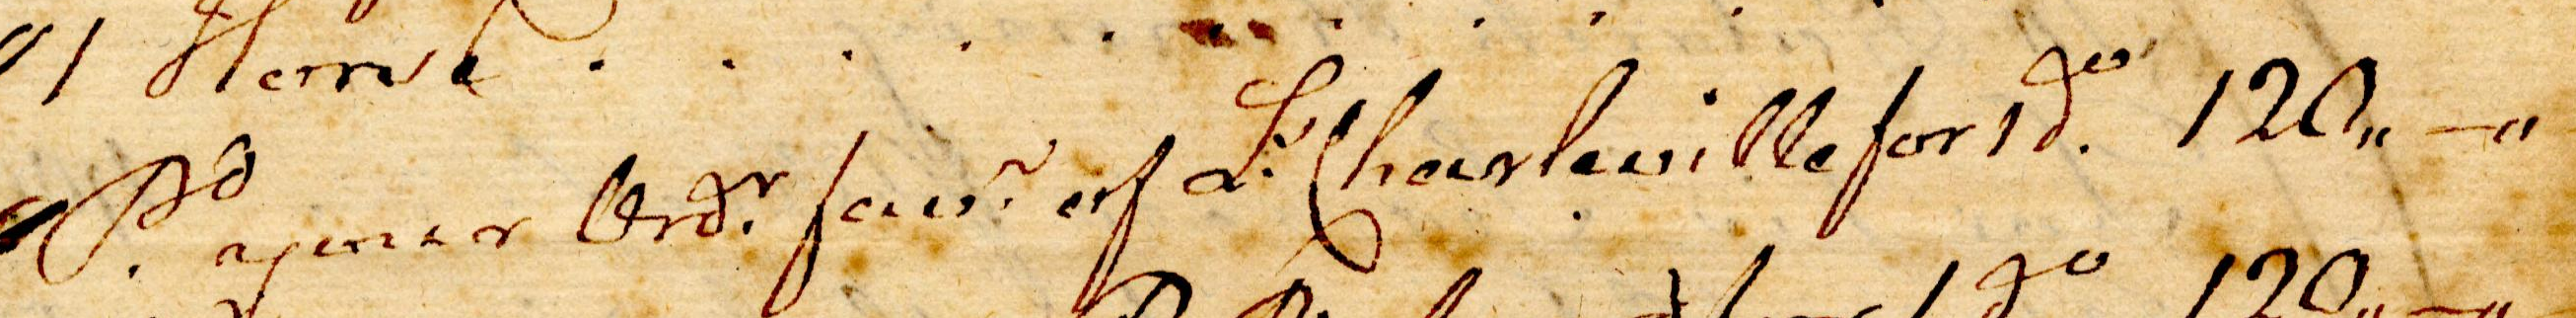P^d. your Ord^r. fav^r. of L^d Charlesville for 1d. 120.-
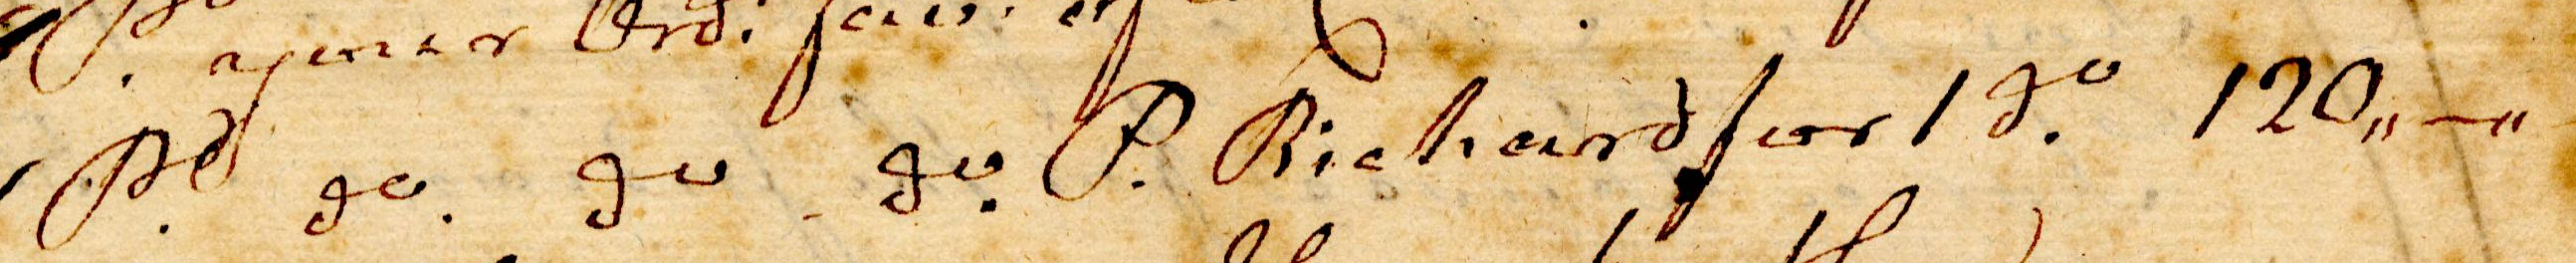P^d &c. &c. &c. P. Richard for 1 d^o. 120.-
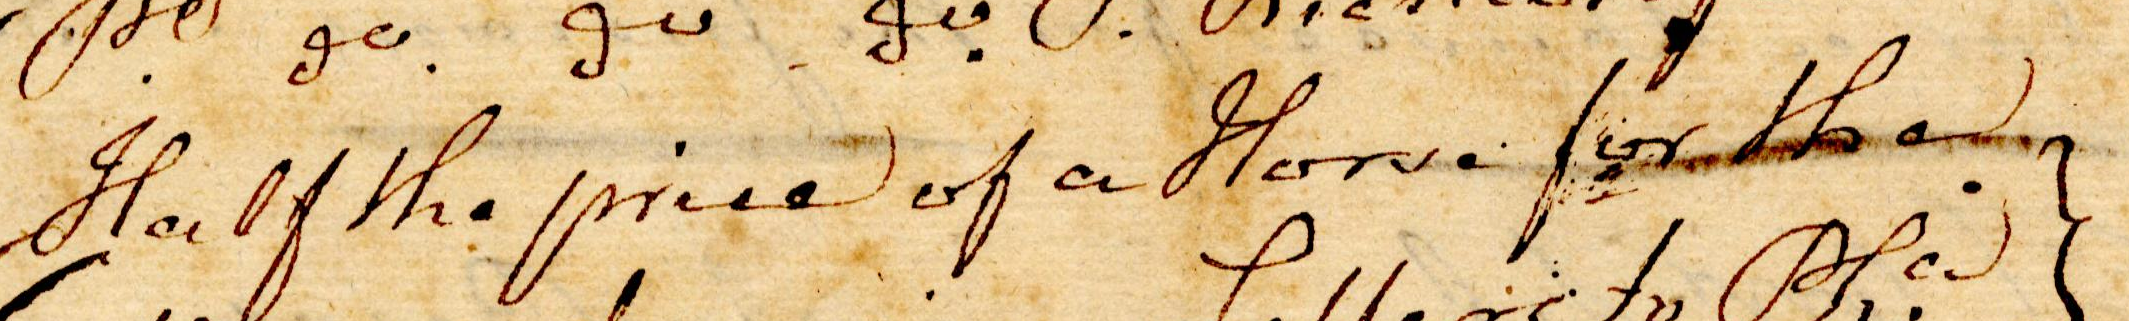Half of the price of a Horse for the
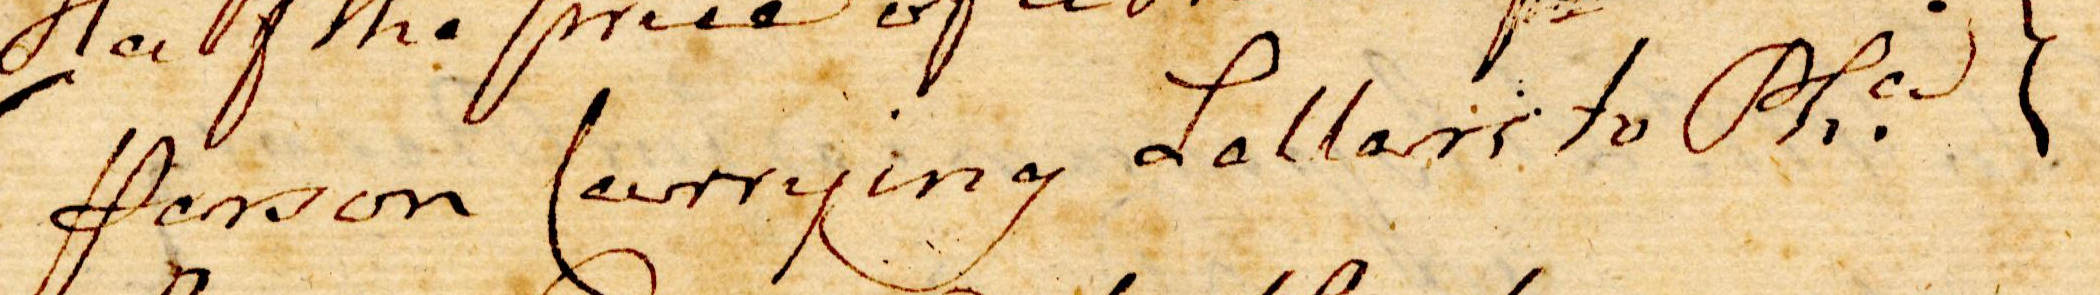Person carrying letters to Ph^a.
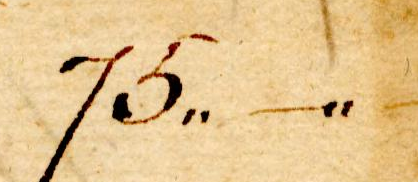75.-.
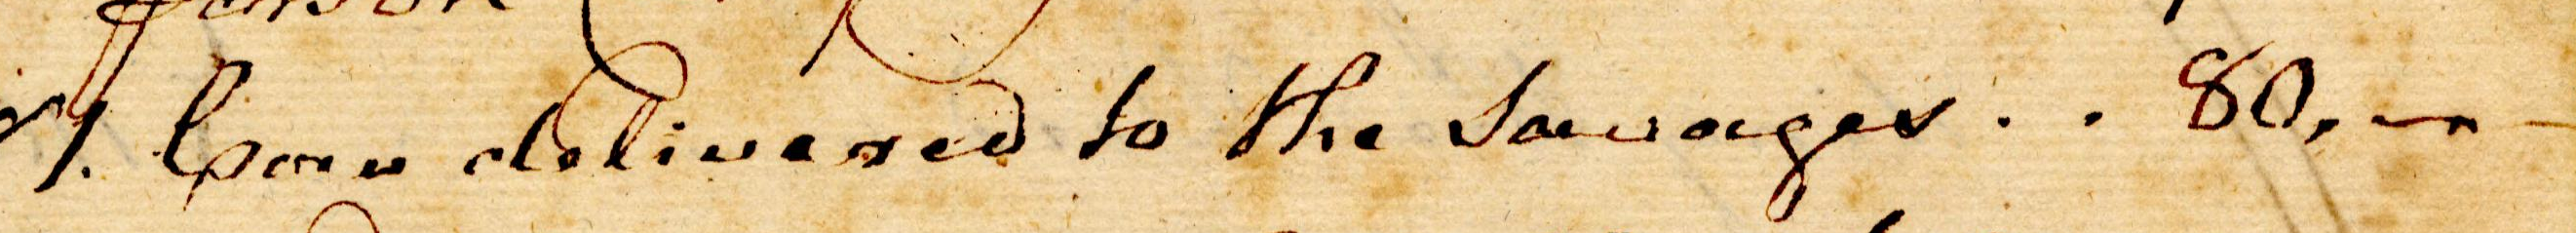1 Gun delivered to the savages.. 80.-
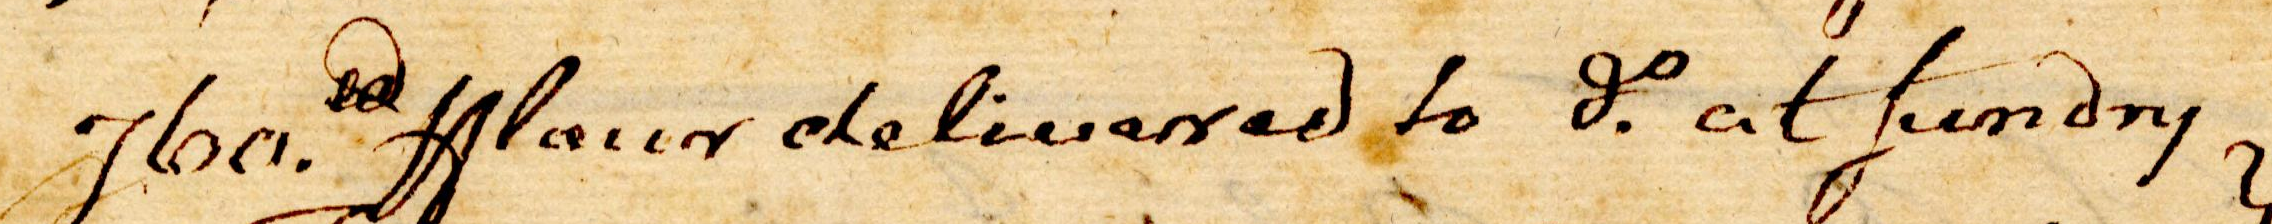760 ^lb flour delivered to d^o. at sundry
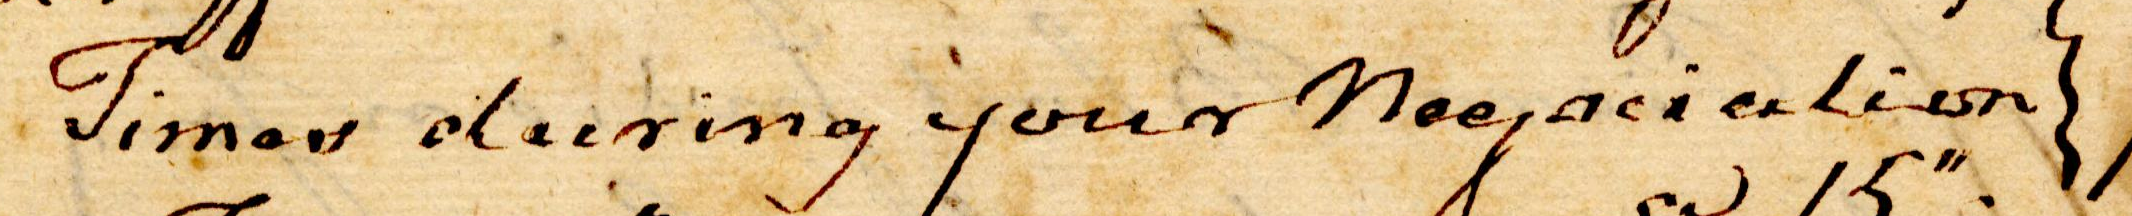Times devering your negociation
